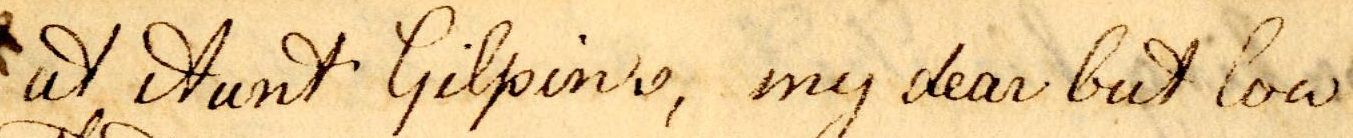at Aunt Gilpins, my dear but low
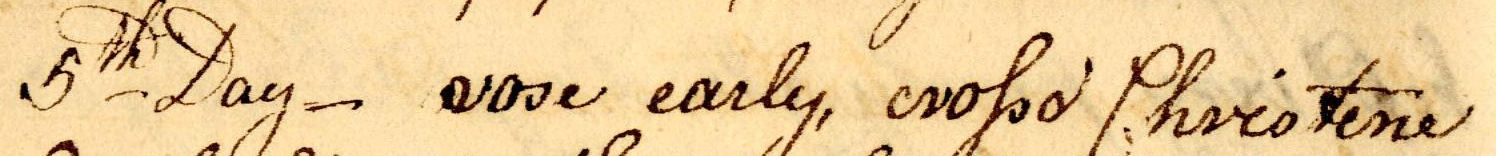5^th Day- rose early, crossd Christene
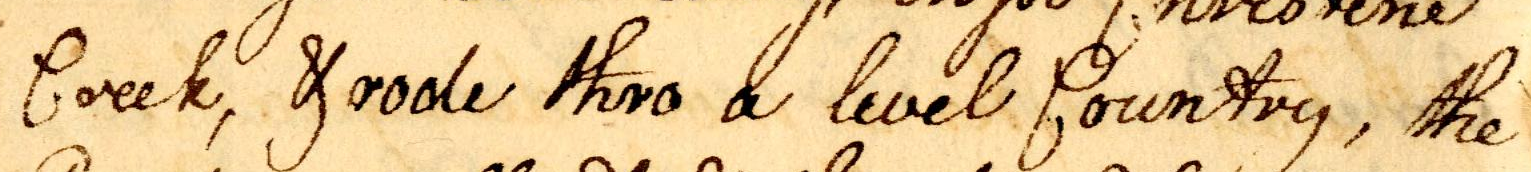Creek, & rode thro a level Country, the
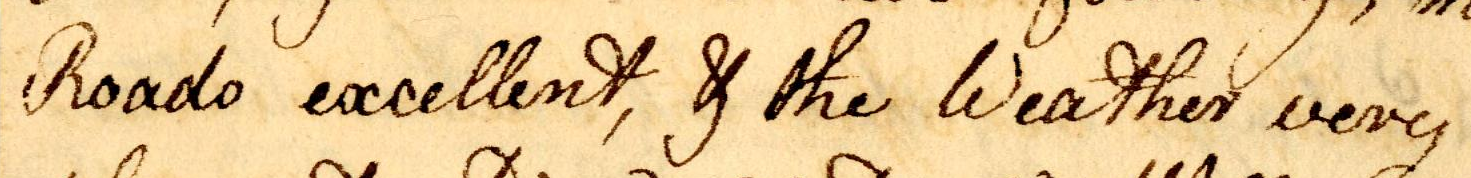Roads excellent, & the Weather very
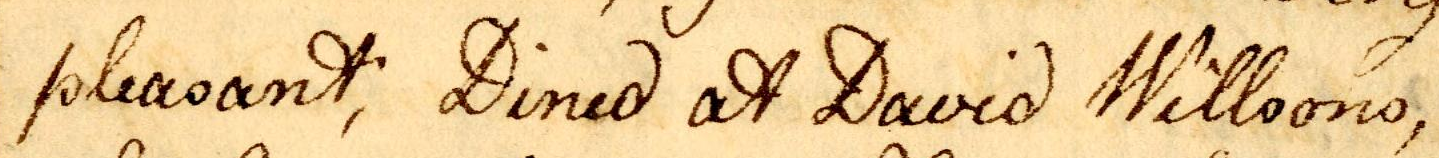pleasant, Dined at David Willsons,
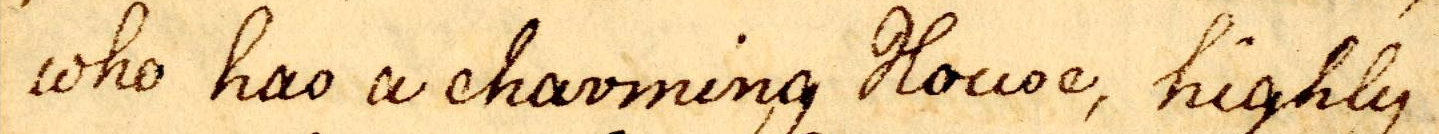who has a charming House, highly
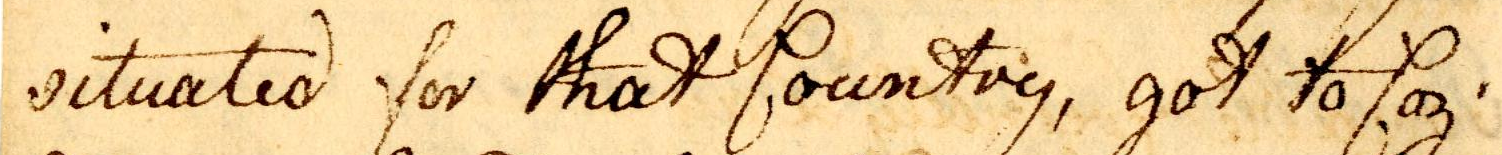situated for that Country, got to Coz
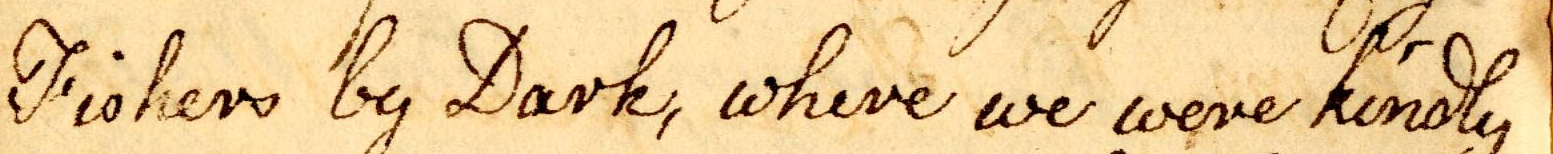Fishers by Dark, where we were kindly
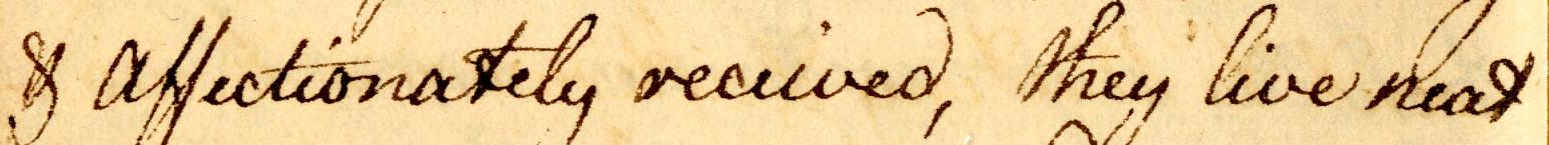& Affectionately received, they live neat
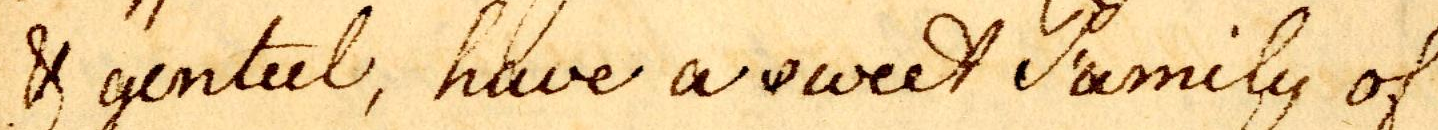& genteel, have a sweet Family of
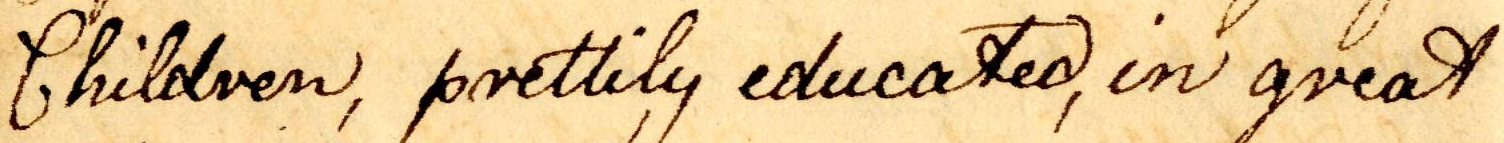Children, prettily educated, in great
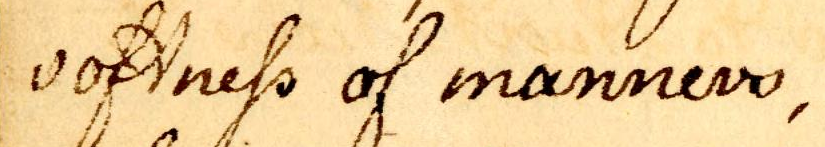softness of manners,
